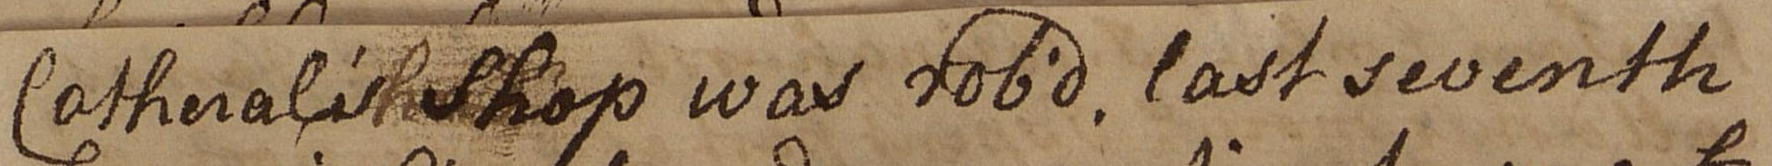Catheral's Shop was rob'd, last seventh
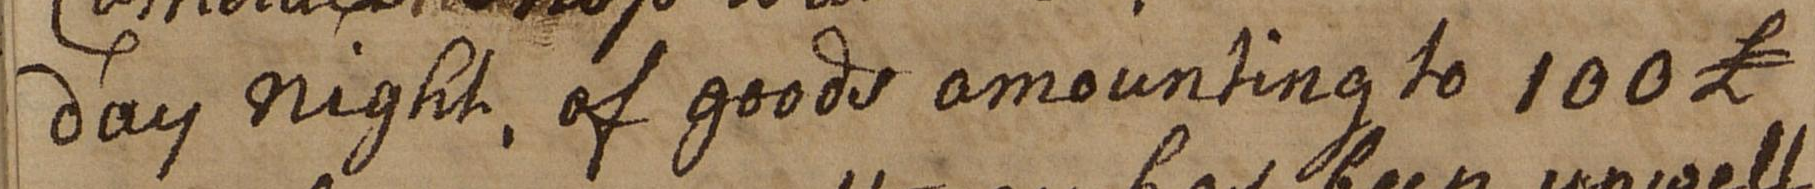day Night, of goods amounting to 100 £
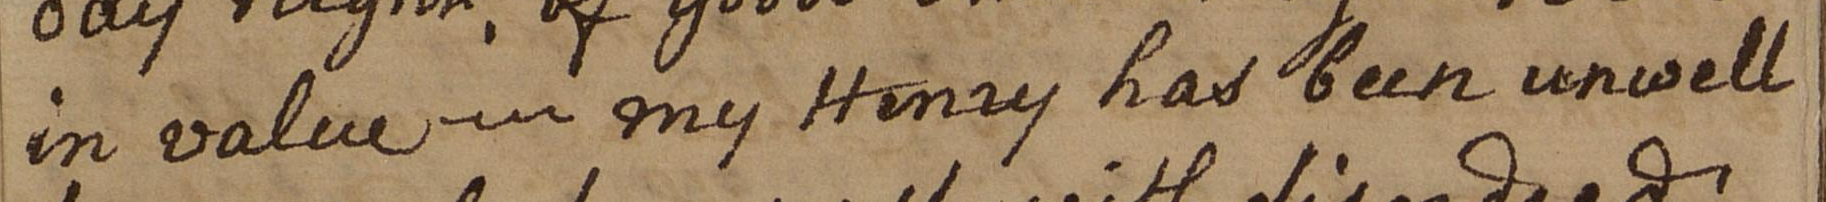in value- my Henry has been unwell
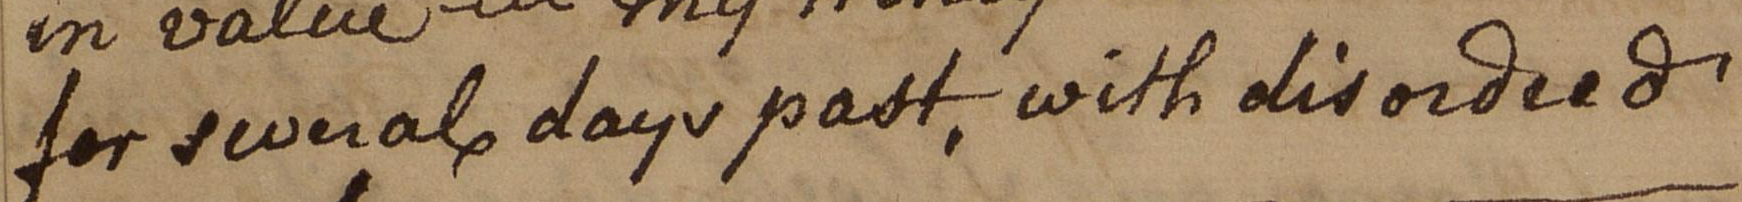for several days past, with disorderd
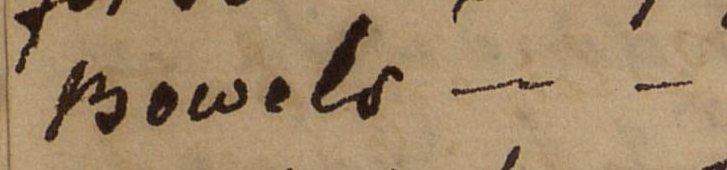Bowels--
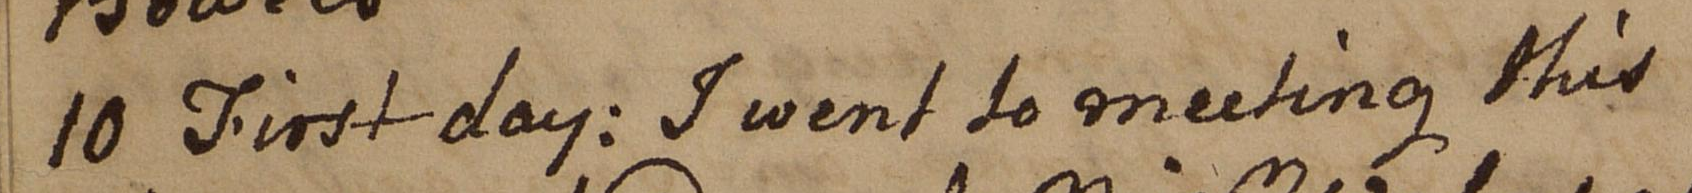10 First day: I went to meeting this
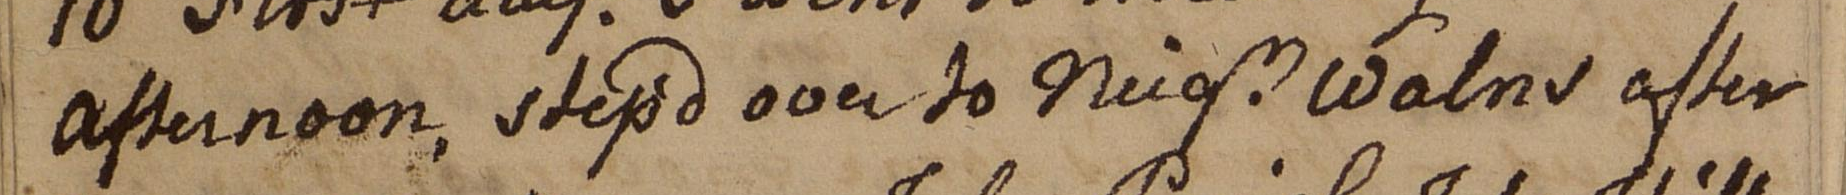Afternoon, step'd over to Neig^r. Walns after
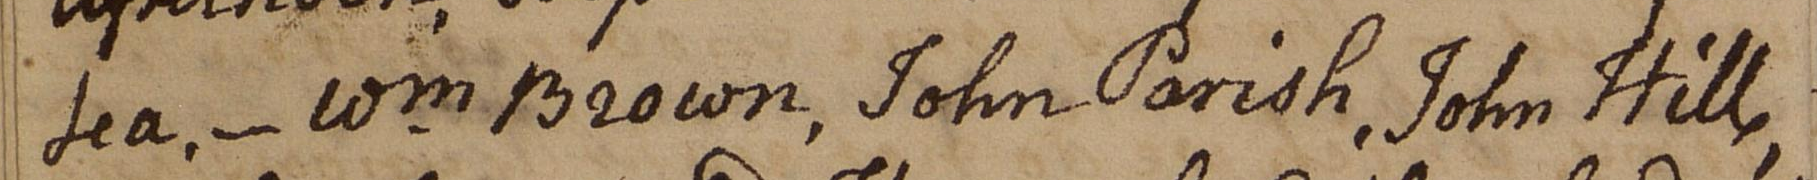tea,- W^m Brown, John Parish, John Hill
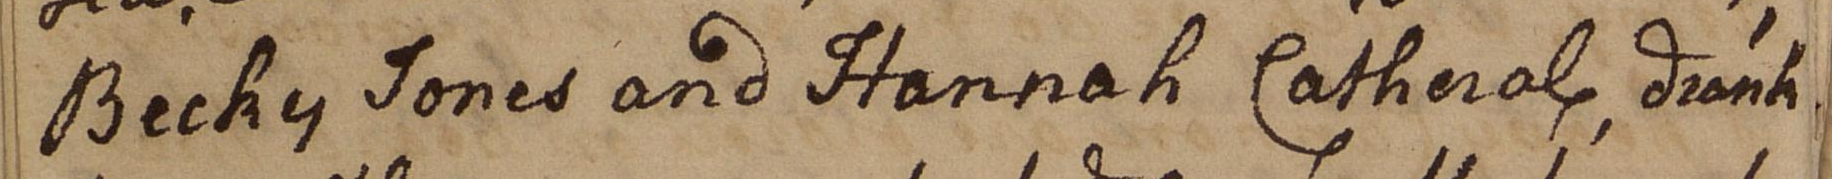Becky Jones and Hannah Catheral, drank
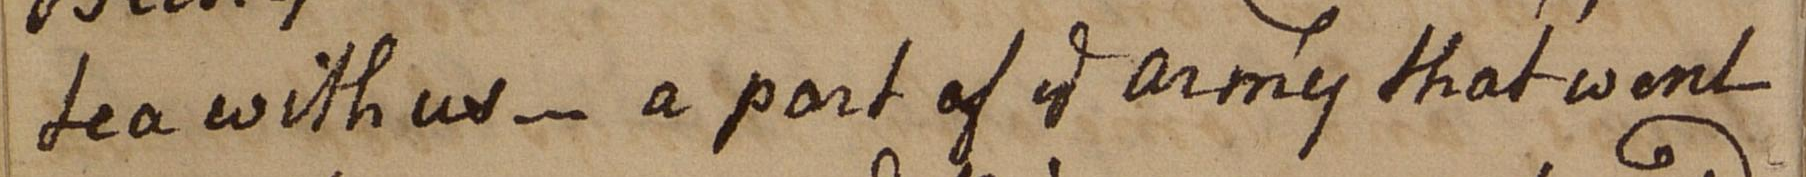tea with us- a part of y^e army that went
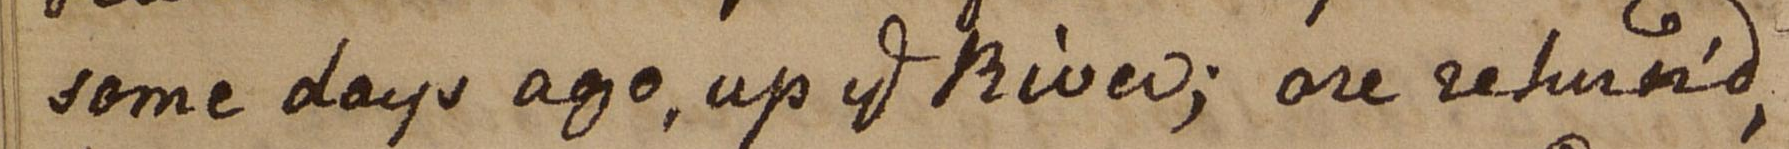some days ago, up y^e River; are return'd,
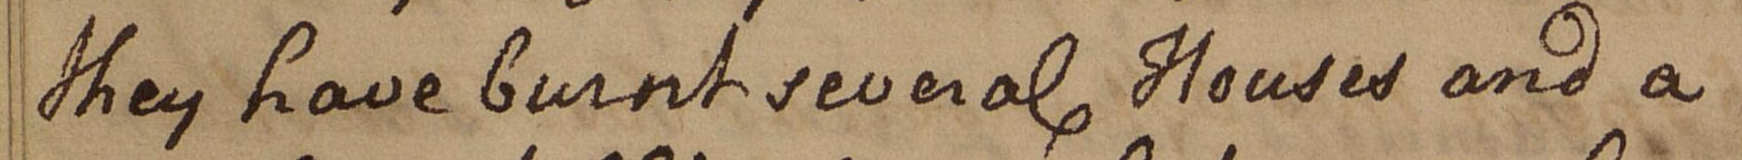they have burnt several Houses and a
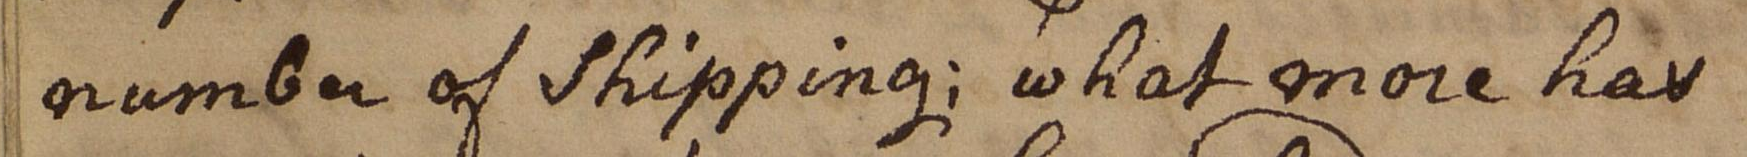number of Shipping; what more has
